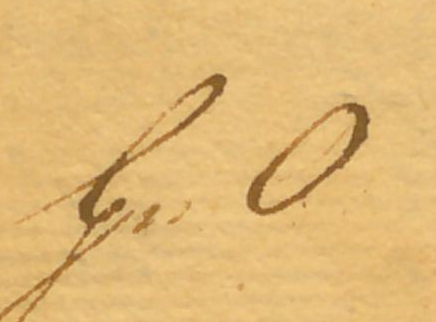G.O
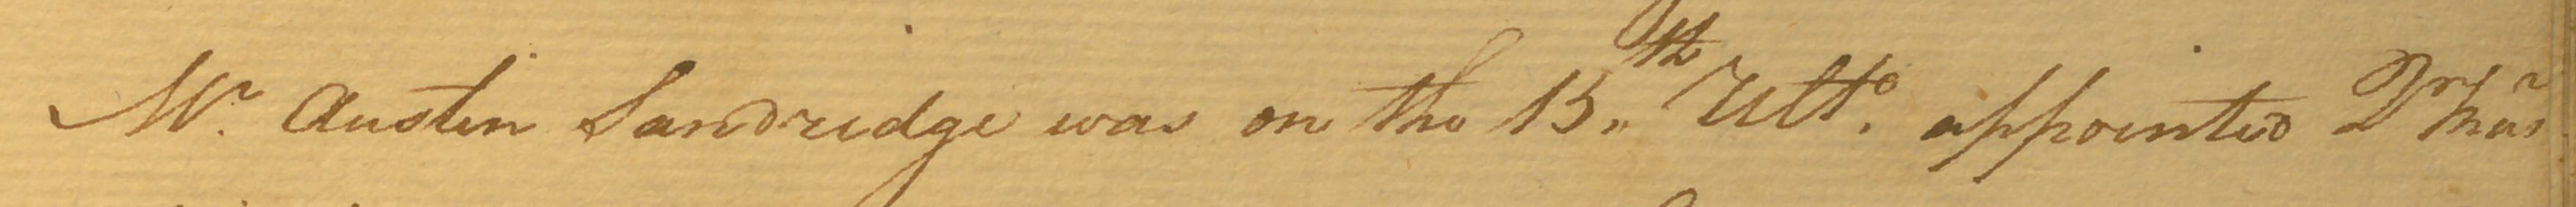M^r. Austin Sandridge was on the 13^th. Ult^o. appointed Q^r Mas^r
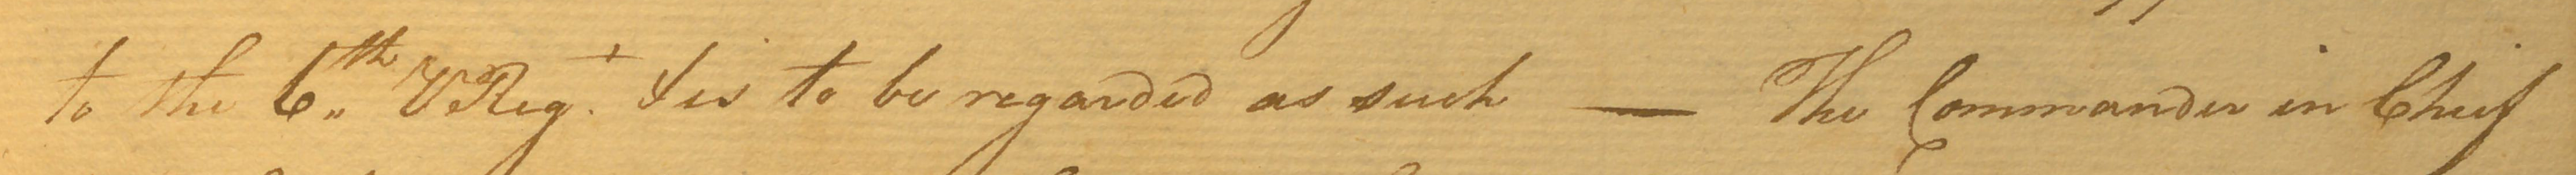to the 6^th. V Reg^t. tis to be regarded such- The Commander in Chief
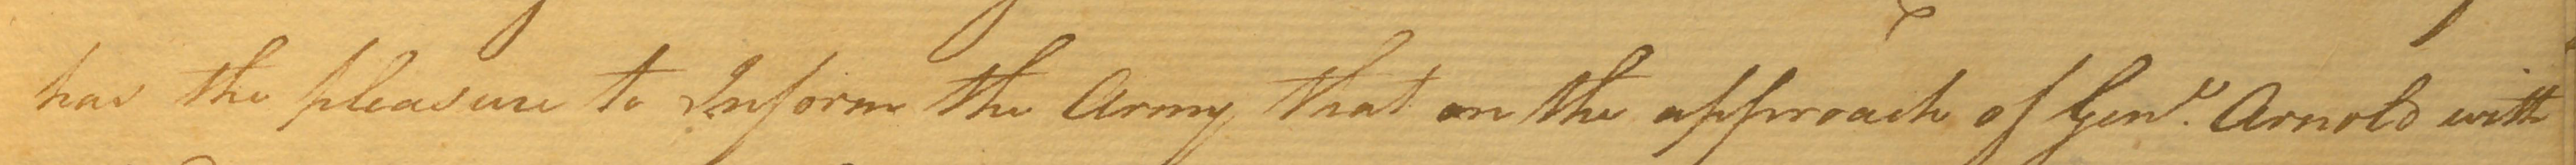has the pleasure to Inform the Army that an approach of Gen^l. Arnold with
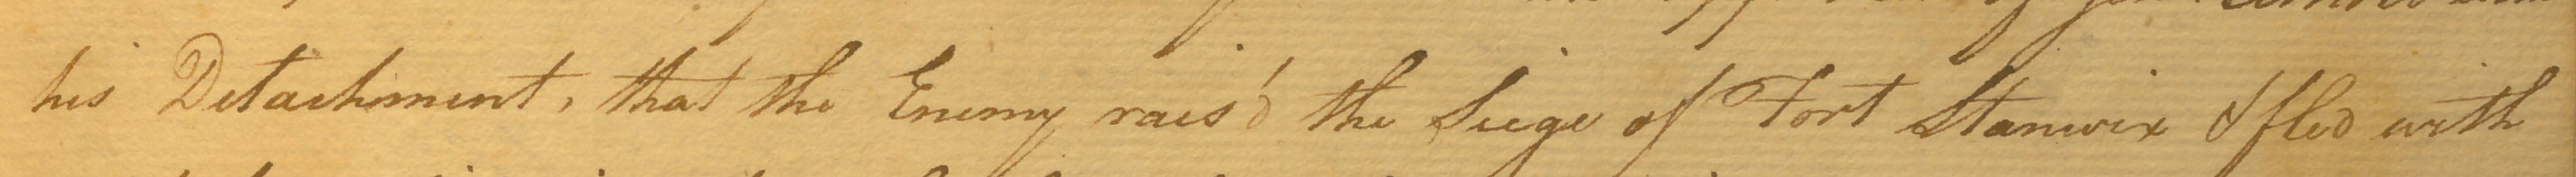his Detachment, that the Enemy rais'd the Siege of Fort Stanwix & fled with
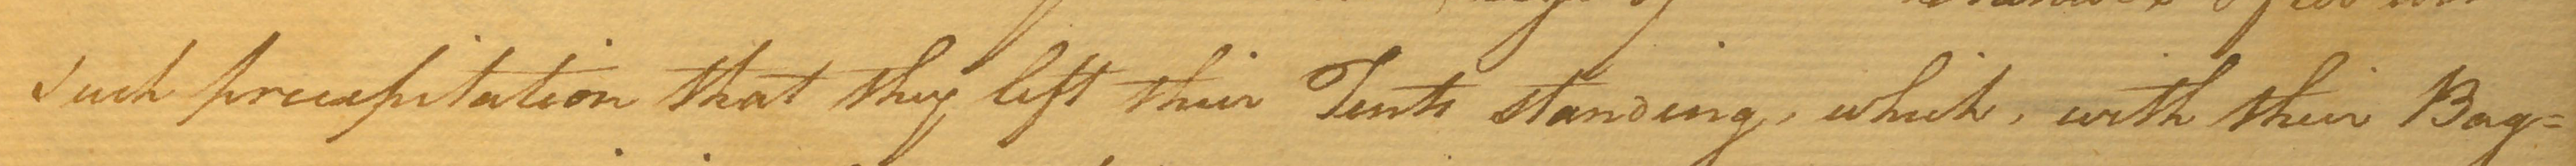such precipitation that they left their Tents standing, which, with their Bag-
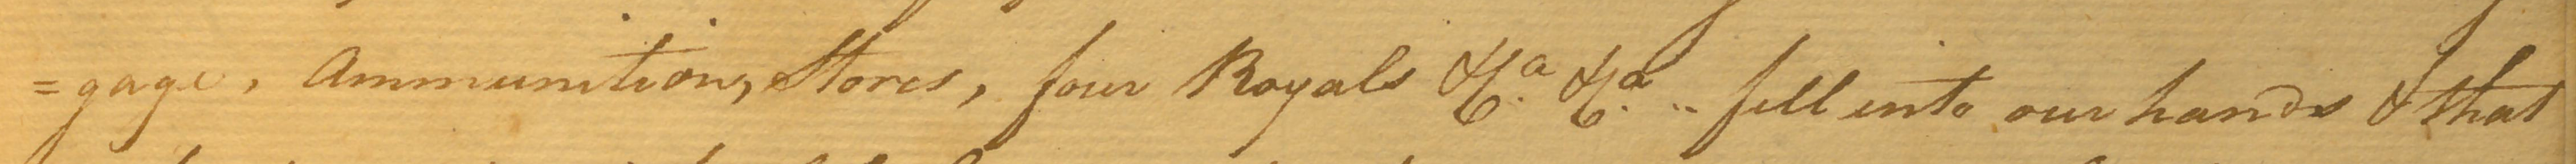-gage, ammunition, Stores, four Royals &c^a. &c^a. fell into our hands & that
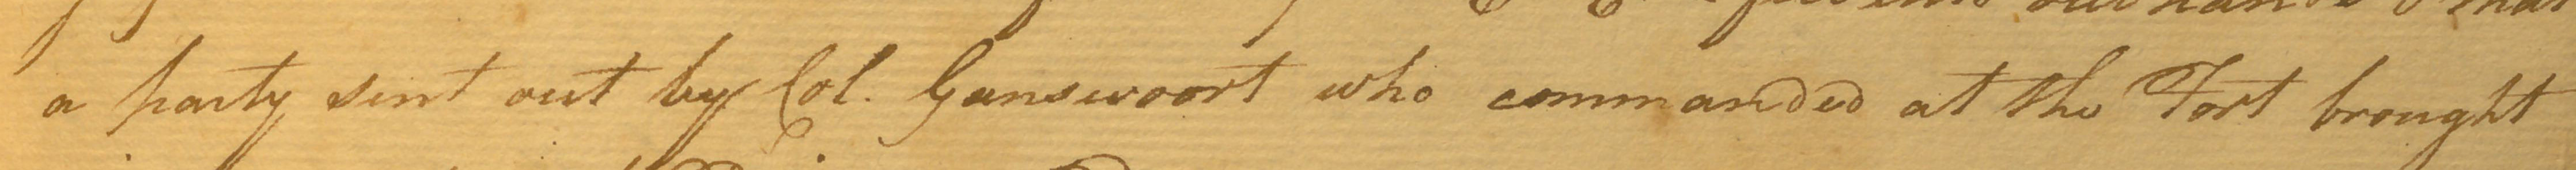a party sent out by Col. Ganswoort who commanded at the Fort brought
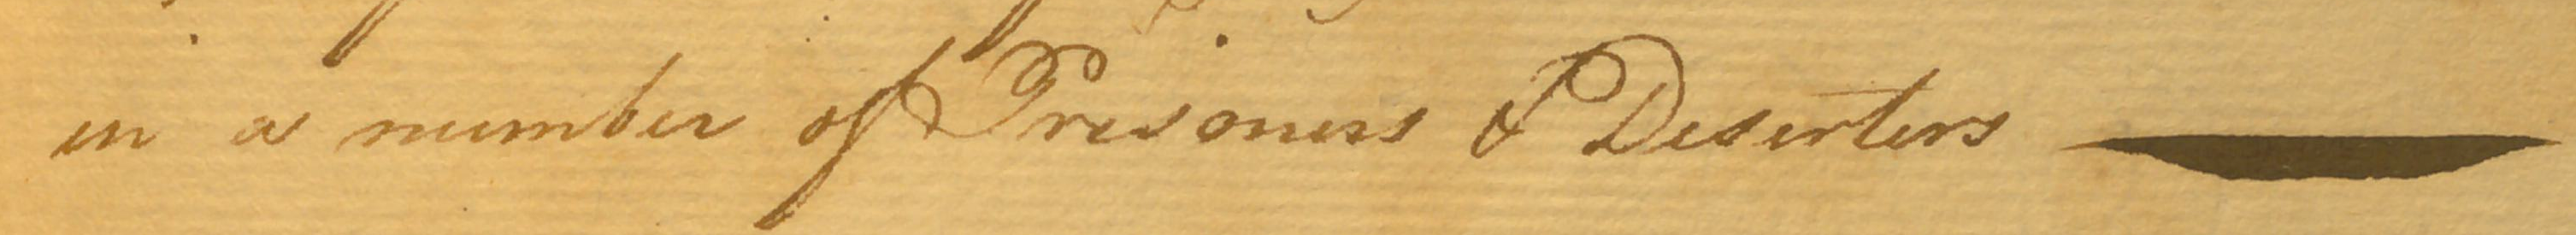in a number of Prisoners & Deserters-
